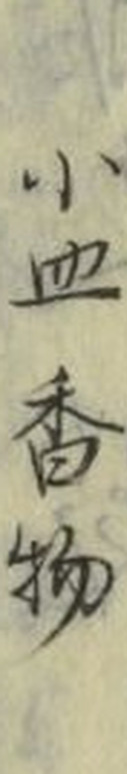小皿香物

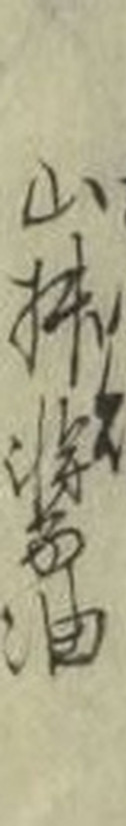山椒醤油
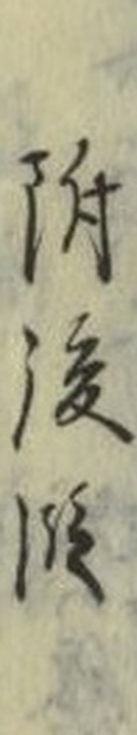附後段
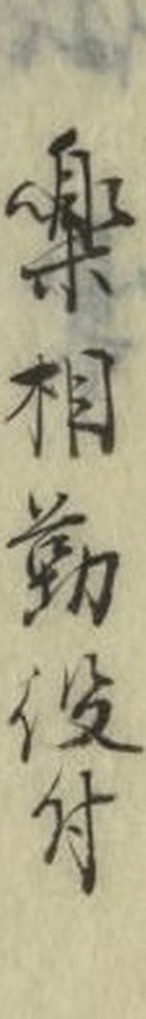楽相勤役付
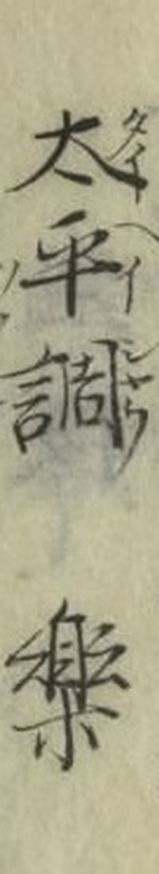太平調楽

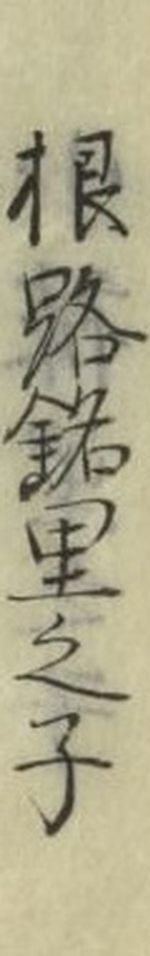三金根路銘里之子
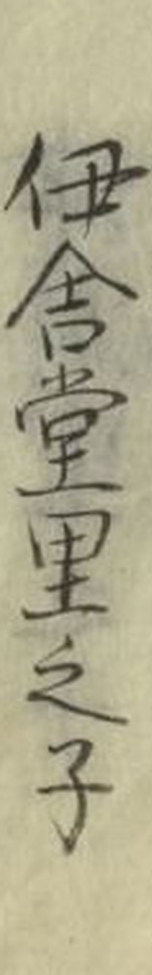管伊舎堂里之子
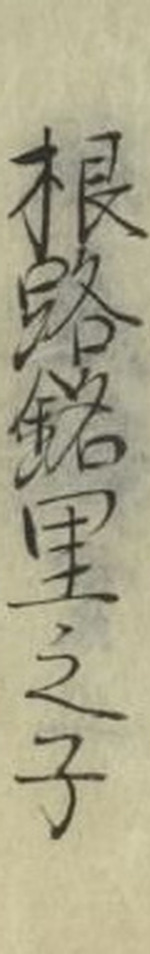三金根路銘里之子
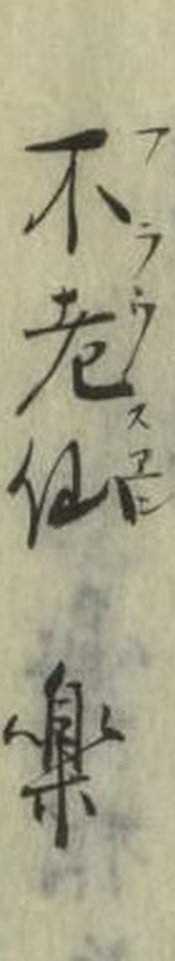不老仙楽
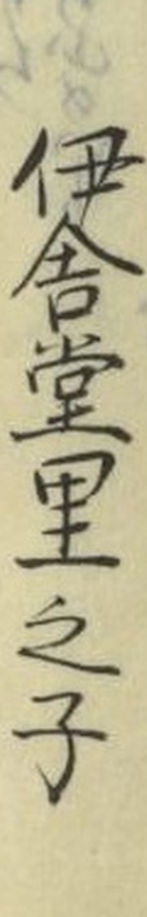管伊舎堂里之子
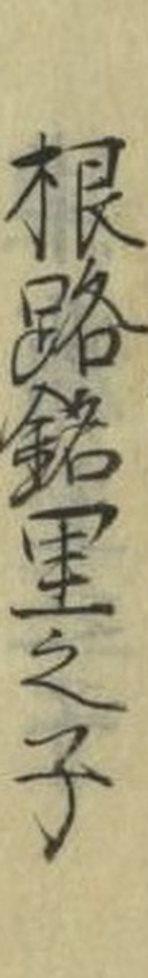三金根路銘里之子
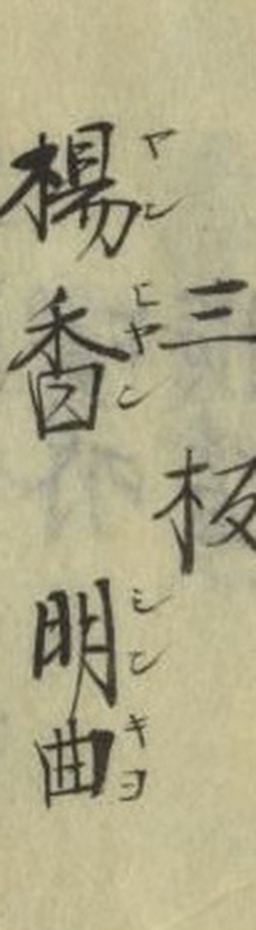楊香明曲
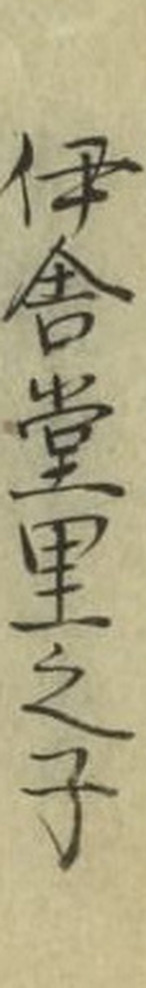管伊舎堂里之子
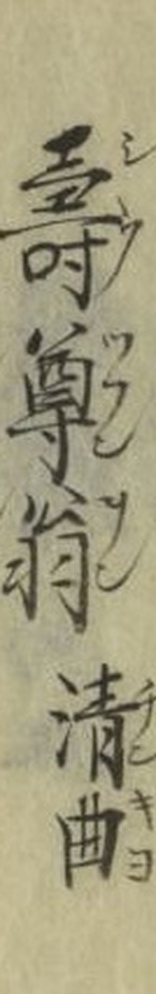寿尊翁清曲
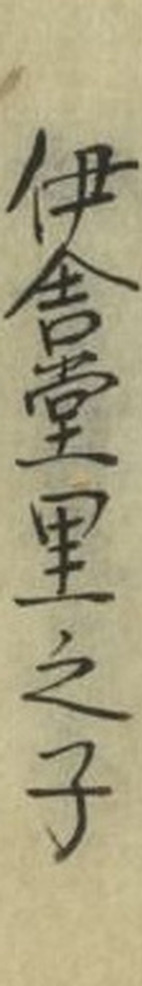管伊舎堂里之子
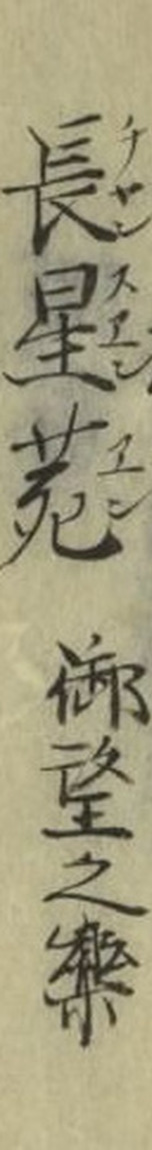長星苑御望之楽
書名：宝永七庚寅年琉球国来聘使日記
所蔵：University of the Ryukyus Library
